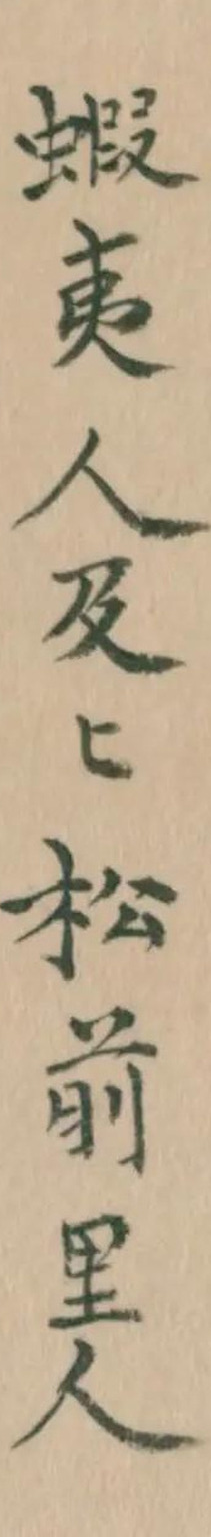蝦夷人及ヒ松前里人
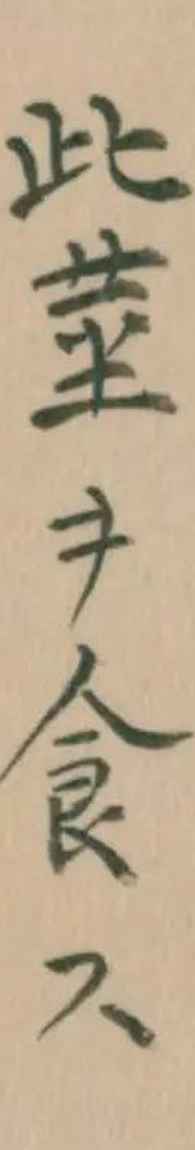此茎ヲ食ス
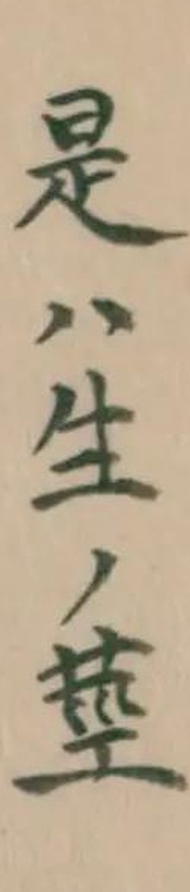是ハ生ノ茎
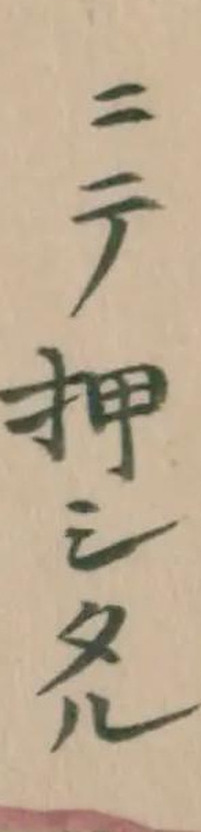ニテ押シタル

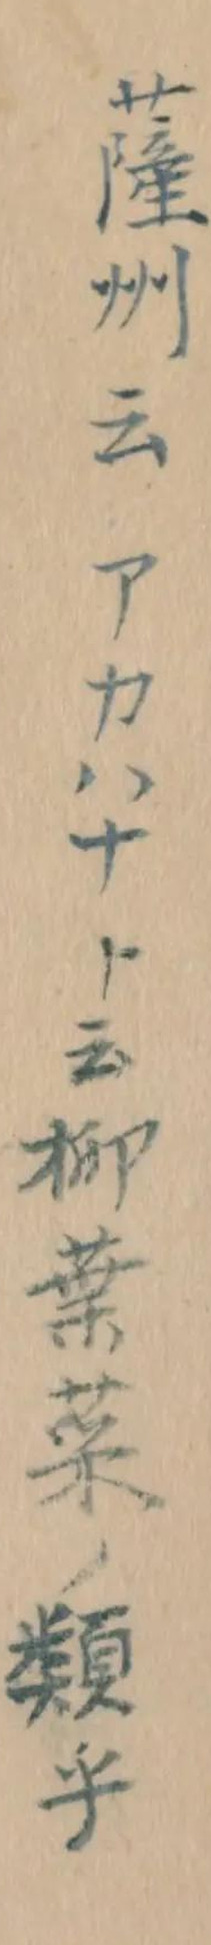薩州云アカハナト云柳葉菜ノ類乎
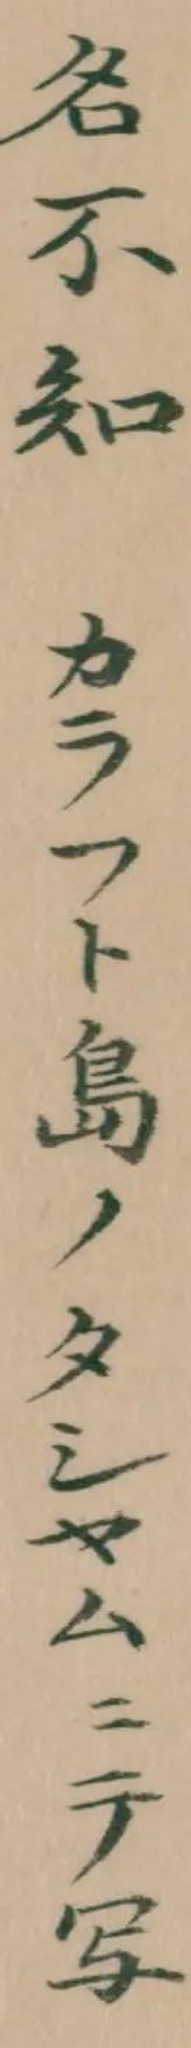名不知カラフト島ノタシヤムニテ写

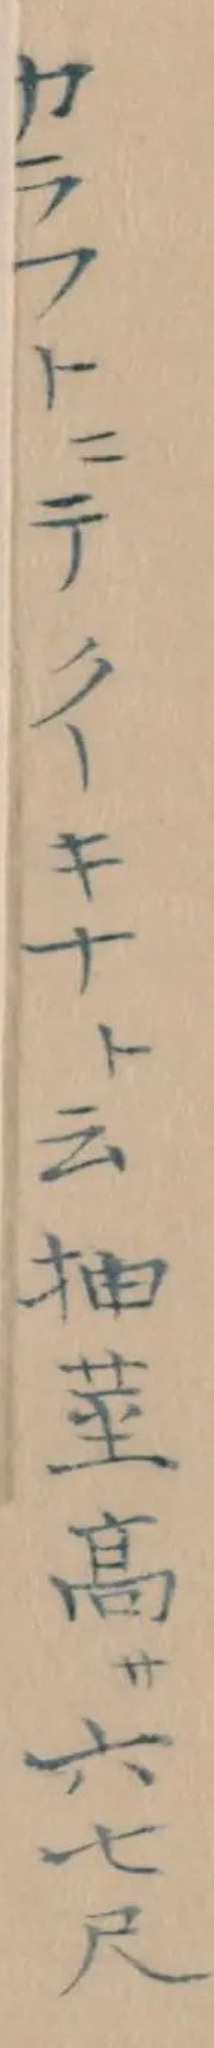カラフトニテクーキナト云抻茎高サ六七尺
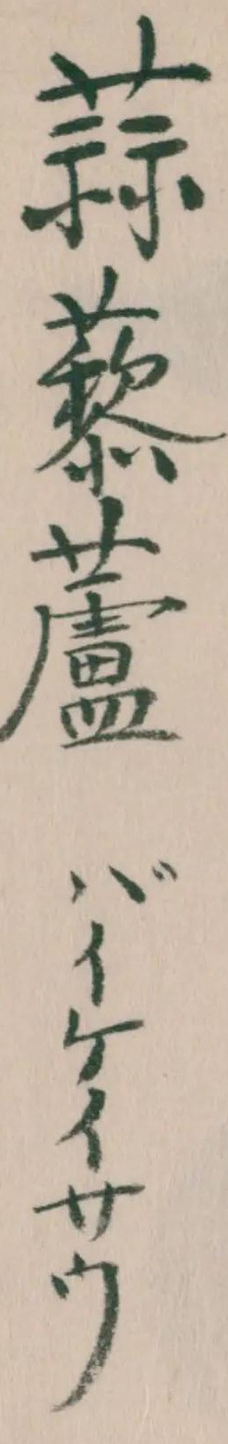蒜藜蘆バイケイサウ
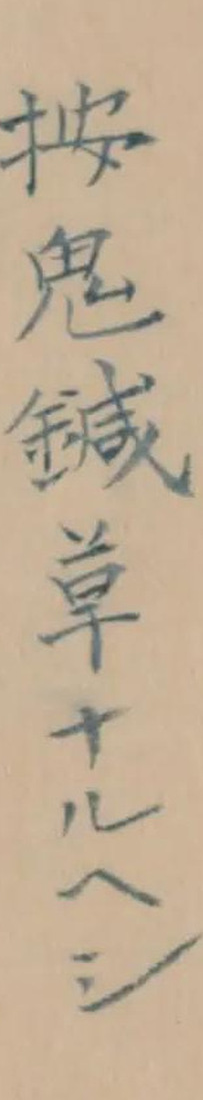按鬼鍼草ナルヘシ
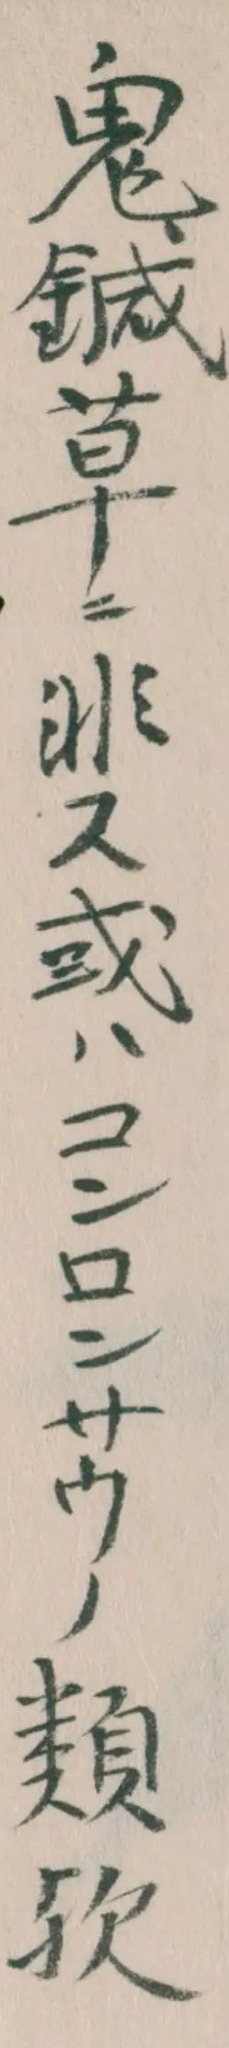鬼鍼草ニ非ス或ハコンロンサウノ類歟

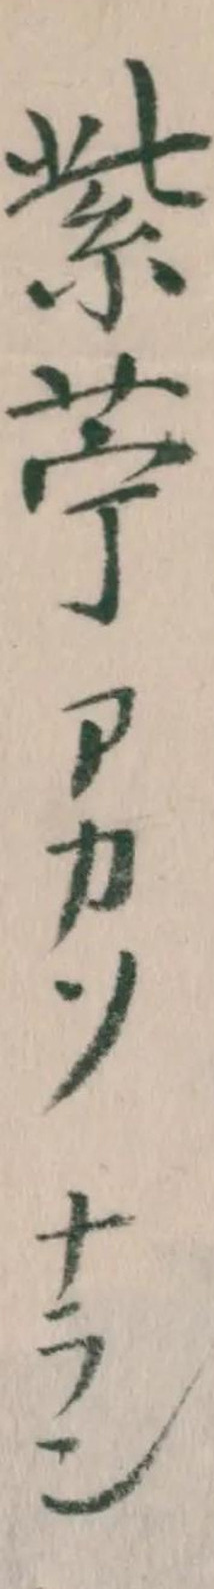紫苧アカソナラン
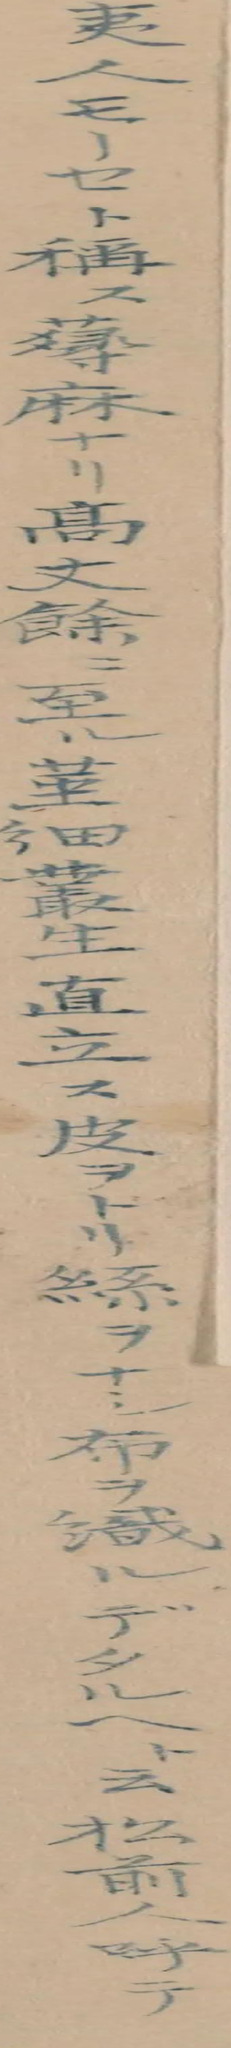夷人モーセト称ス蕁麻ナリ高丈余ニ至ル茎細叢生直立ス皮ヲトリ糸ヲナシ布ヲ織ルデタルヘト云松前人呼テ
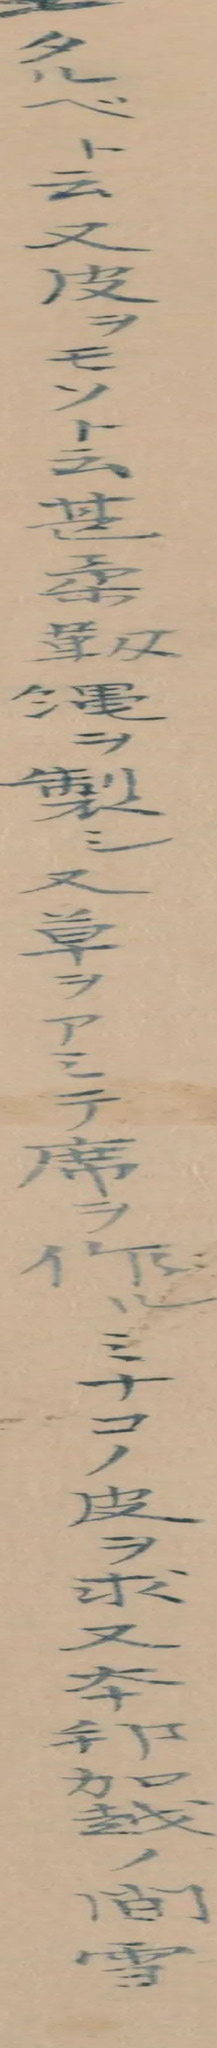ユタルベト云又皮ヲモソト云甚柔靭縄ヲ製シ又草ヲアミテ席ヲ作ルミナコノ皮ヲ求又本邦加越ノ間雪
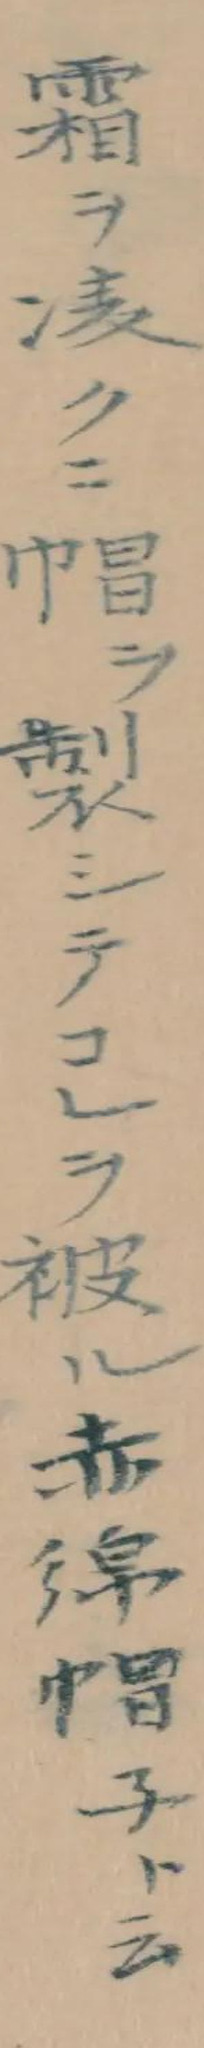霜ヲ凌クニ帽ヲ製シテコレヲ被ル赤綿帽子ト云
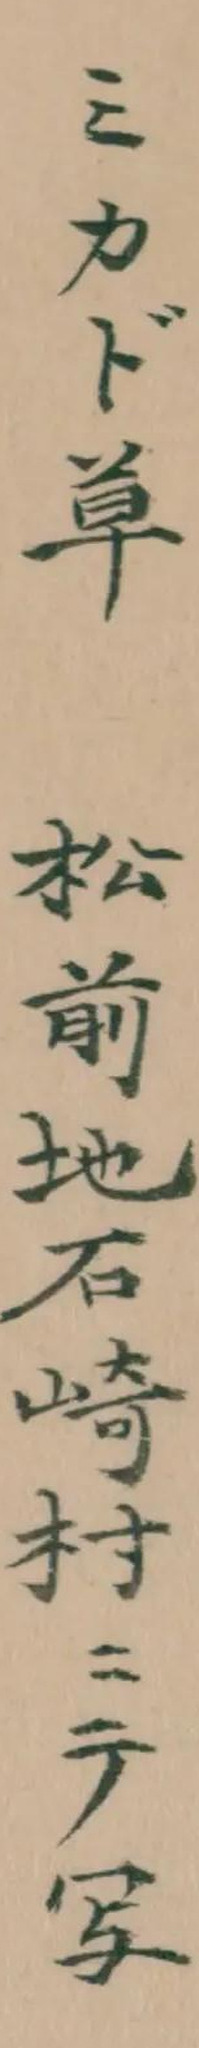ミカド草松前地石崎村ニテ写
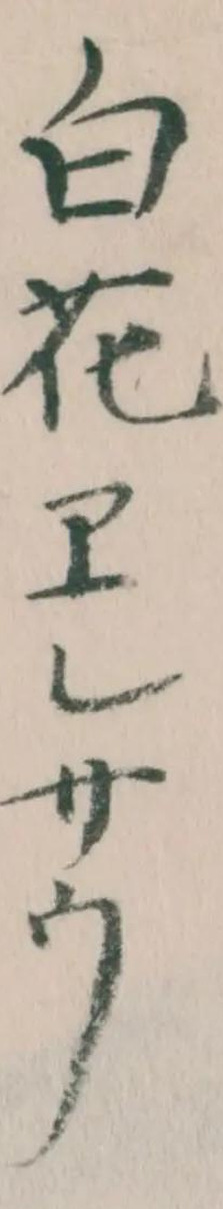白花ヱレサウ
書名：蝦夷草木図
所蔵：国立国会図書館 National Diet Library, JAPAN
